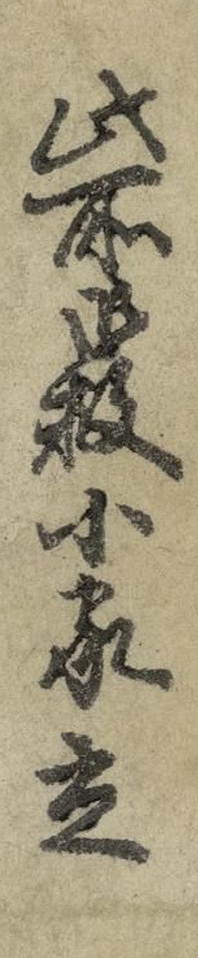此所御救小家立
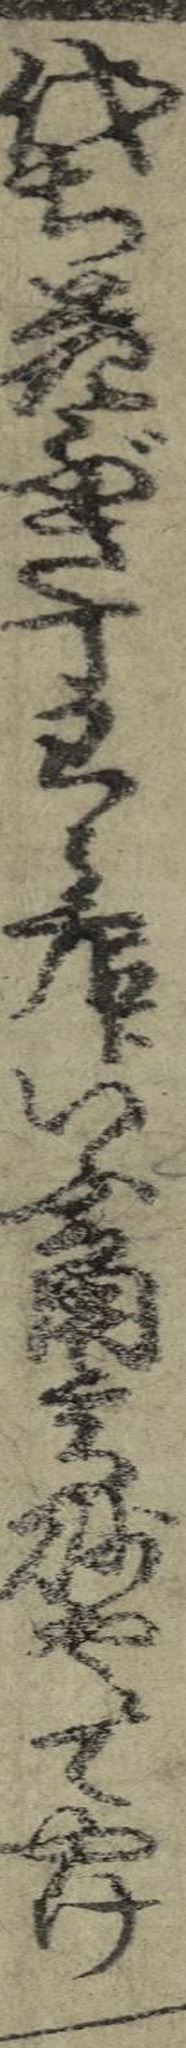代ち花ぶさ丁わら店トいふ角高砂や二てやけ
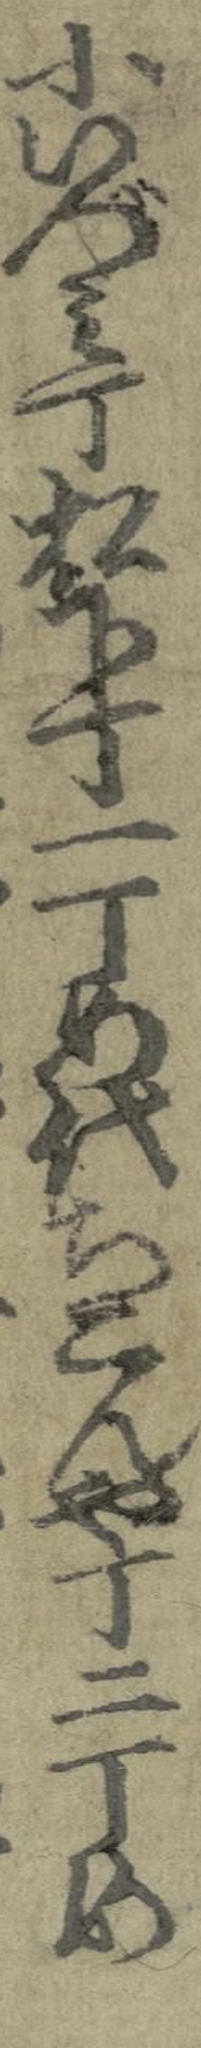小いづミ丁松下丁一丁め代ちこんや丁二丁め
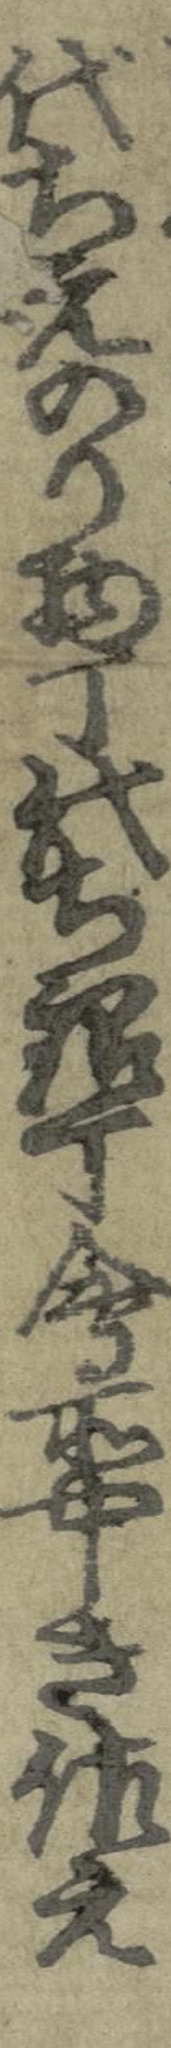代ち元のり物丁代ち銀丁会所やしき佐え
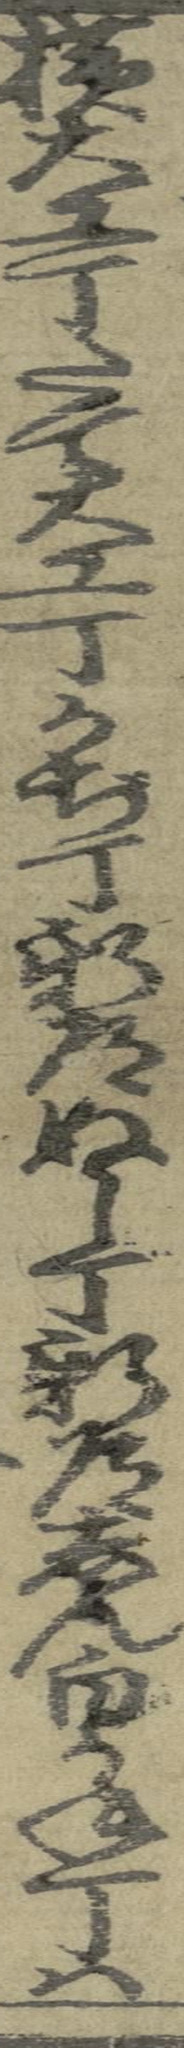横大工丁たて大工丁かぢ丁新道ぬし丁新道しん白かね丁ハ
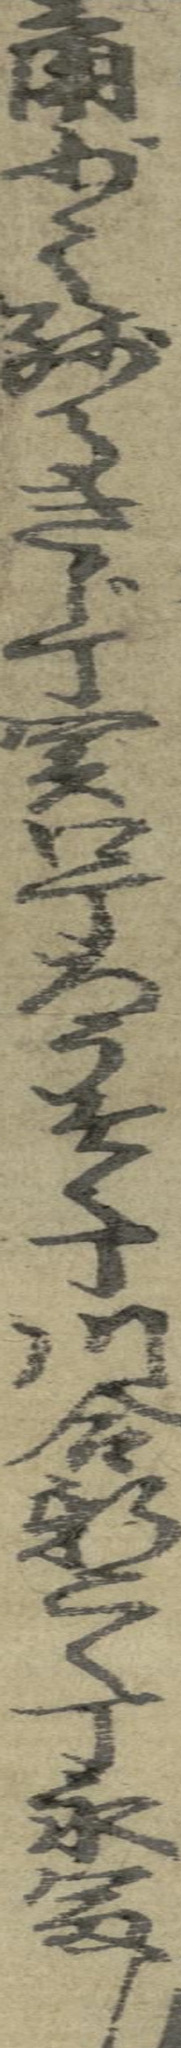角少々残るきじ丁関口丁ろうそく丁川合新こく丁永富
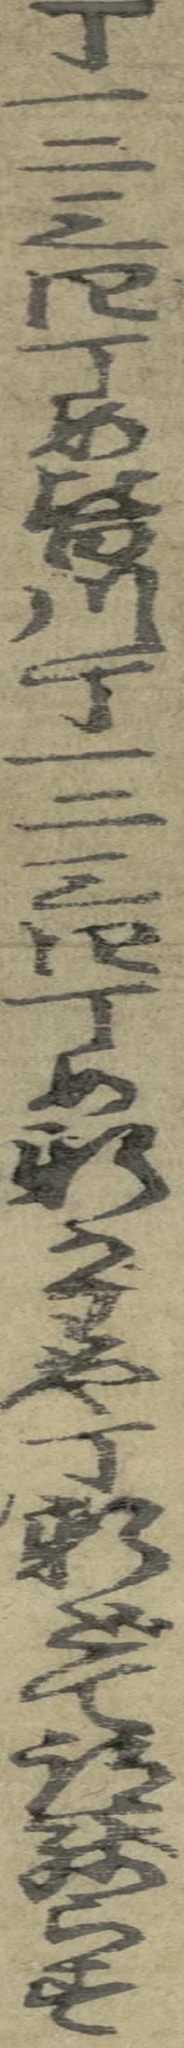丁一二三四丁め皆川丁一二三四丁め新かわや丁新どて跡残らす
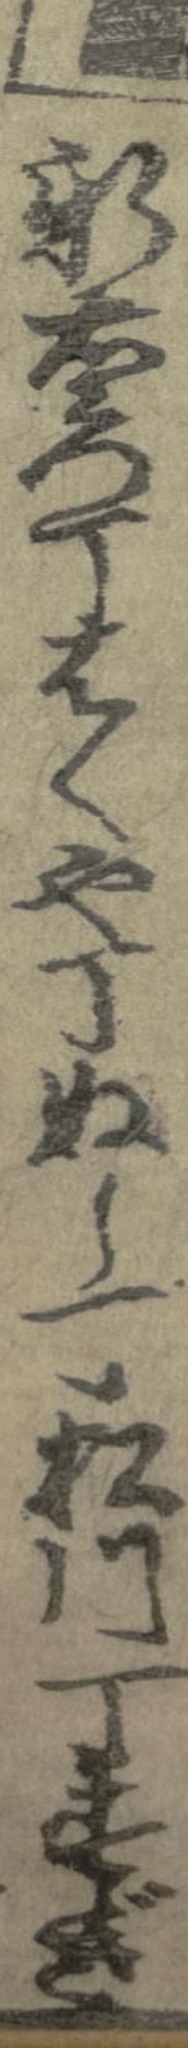新右衛門丁はくや丁ぬし丁松川丁すぎ
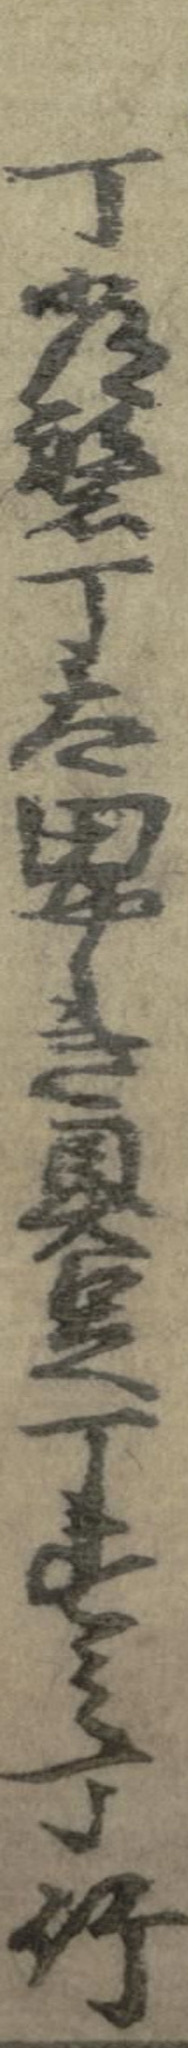丁常磐丁太田やしき具足丁すミ丁竹
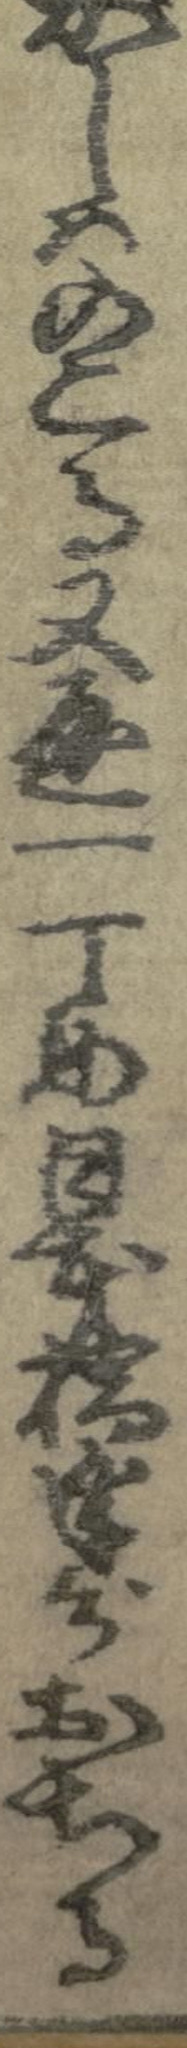がしハのこるまた通一丁め日本橋半分おちる
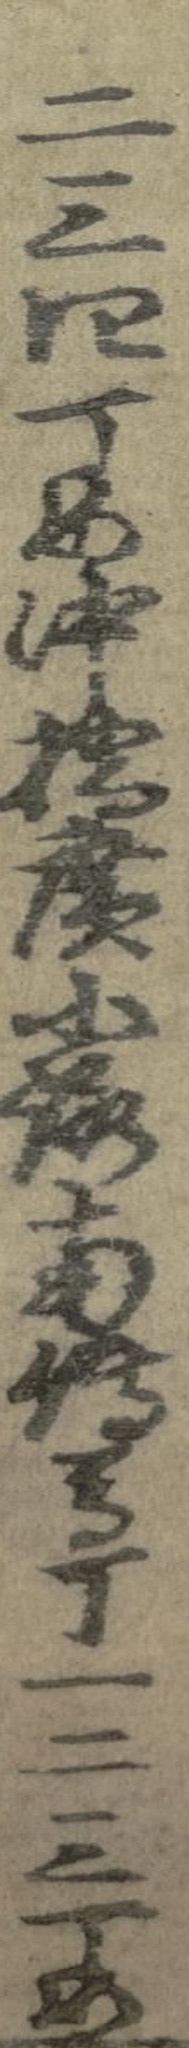二三四丁め中橋広小路南伝馬丁一二三丁め
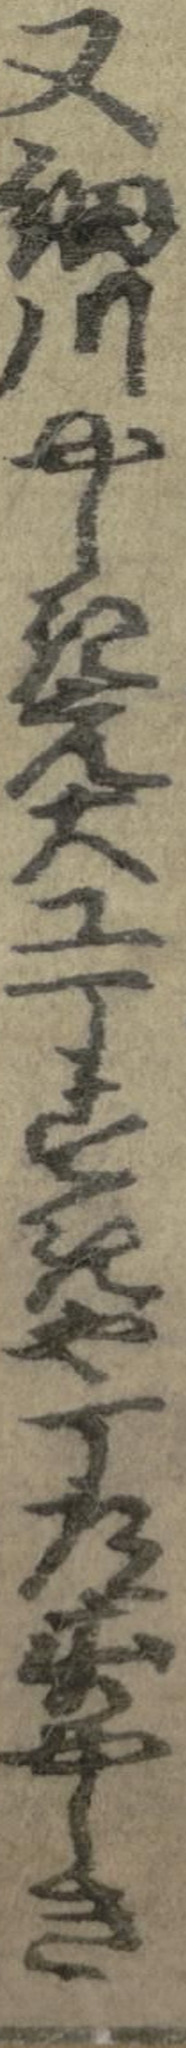又細川やしき元大工丁すきや丁道寄やしき
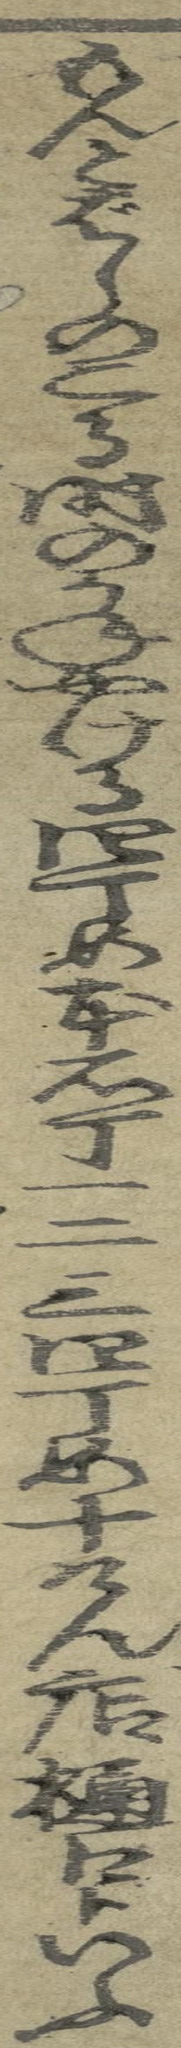もんとばし橋のこる時のかねやける四丁め本石丁一二三四丁め十けん店樋口トいふ
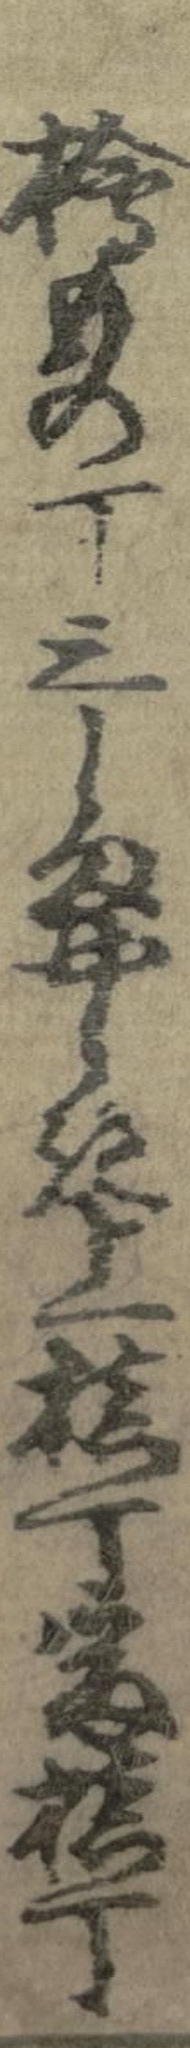檜もの丁三しまやしきハ上槙丁富槙丁
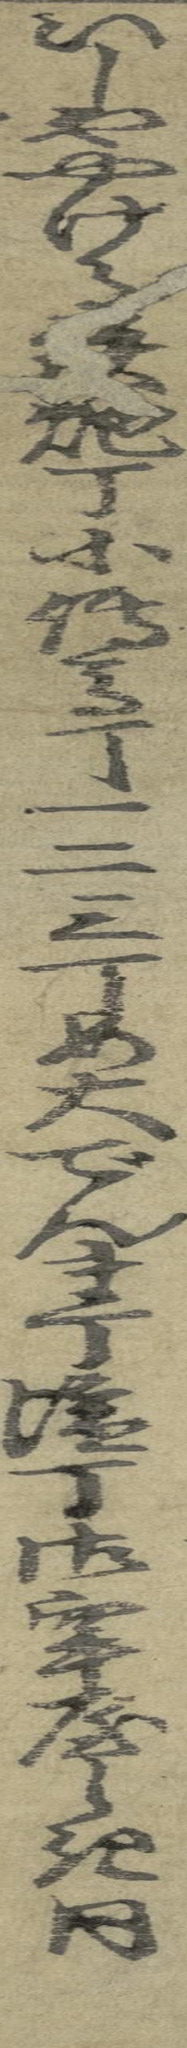いしややける鉄炮丁小伝馬丁一二三丁め大でんま丁濱丁御牢やしき同
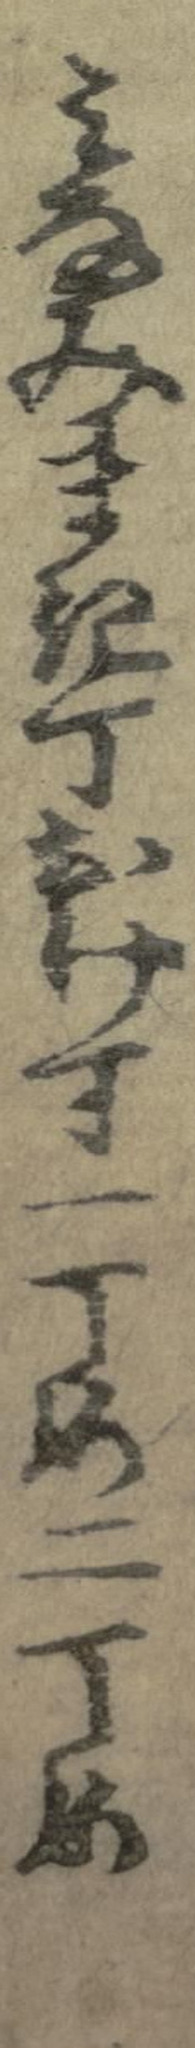ミなみまき丁おけ丁一丁め二丁め
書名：焼場方角明細圖
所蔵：東京大学地震研究所図書室 Earthquake Research Institute Library, The University of Tokyo, JAPAN
